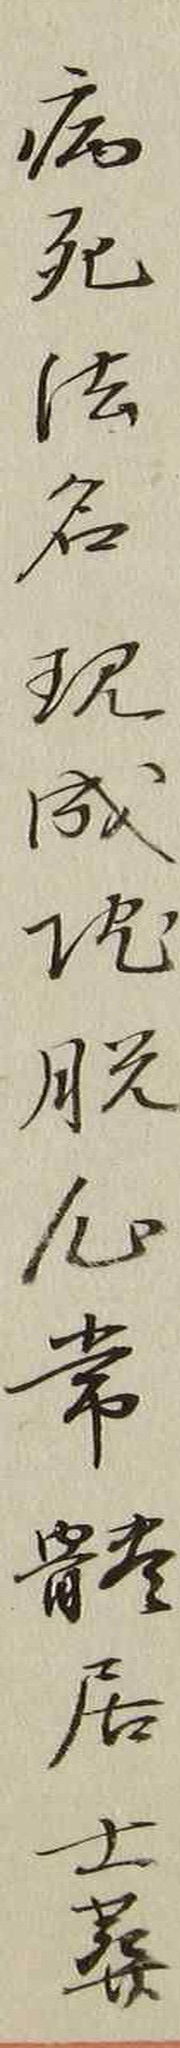病死法名現成院脱心常体居士葬
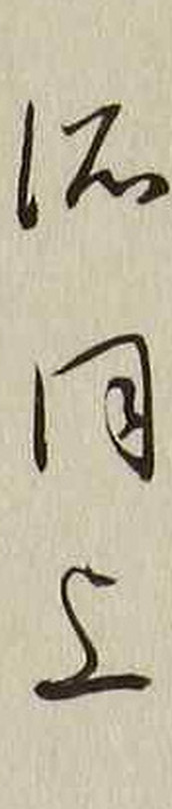所同上
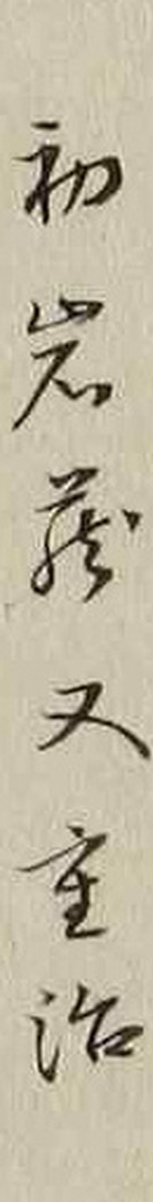初岩蔵又重治
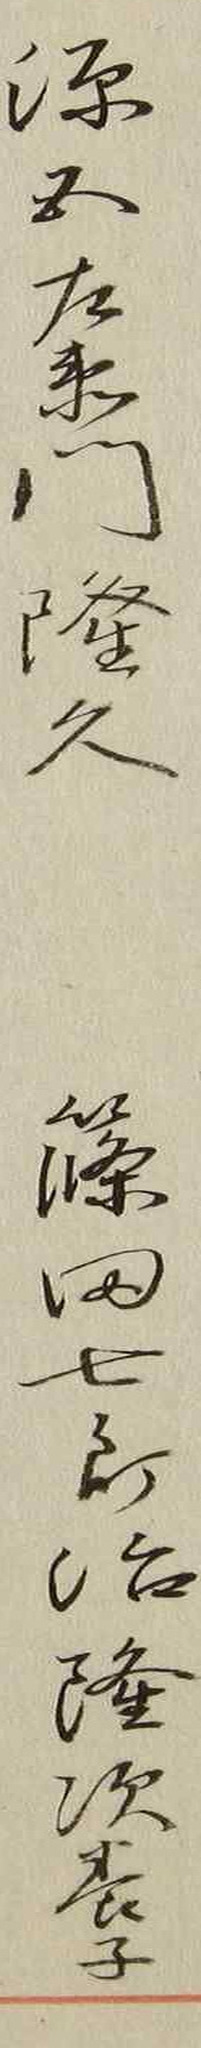源五左衛門降久篠田七郎治隆次養子
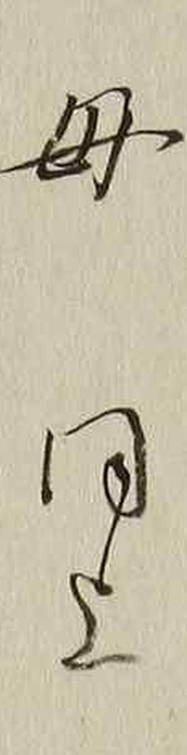母同上
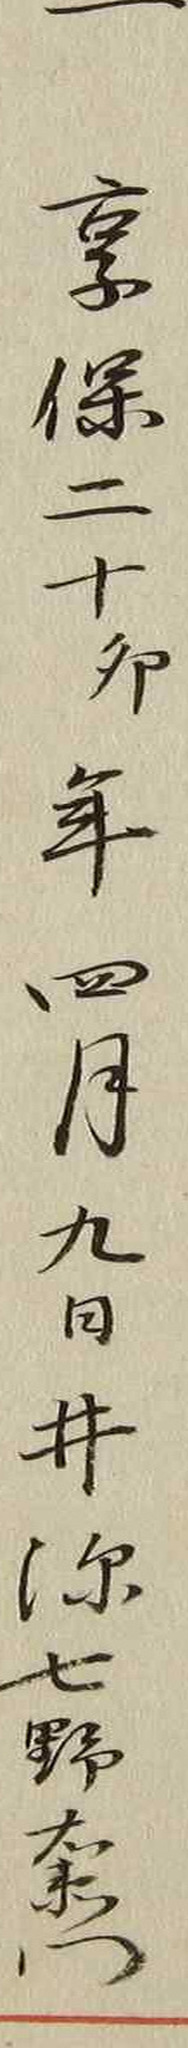一享保二十卯年四月九日井深七野右衛門
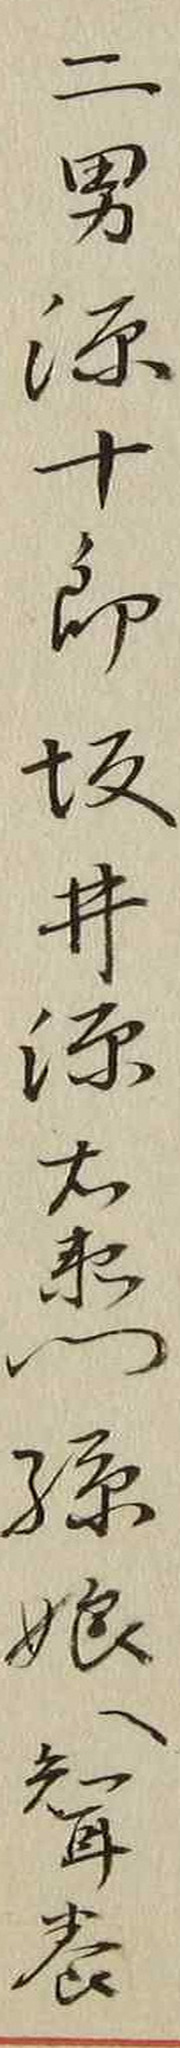二男源十郎坂井源右衛門孫娘へ聟養
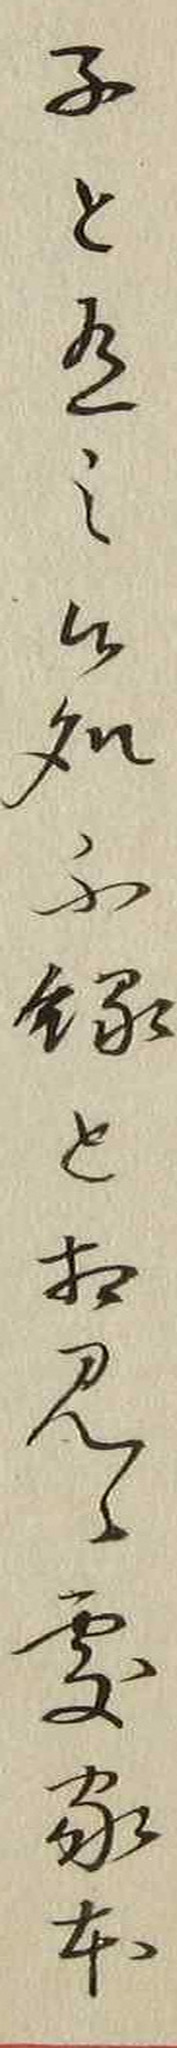子と有之候処不縁と相見候処家本
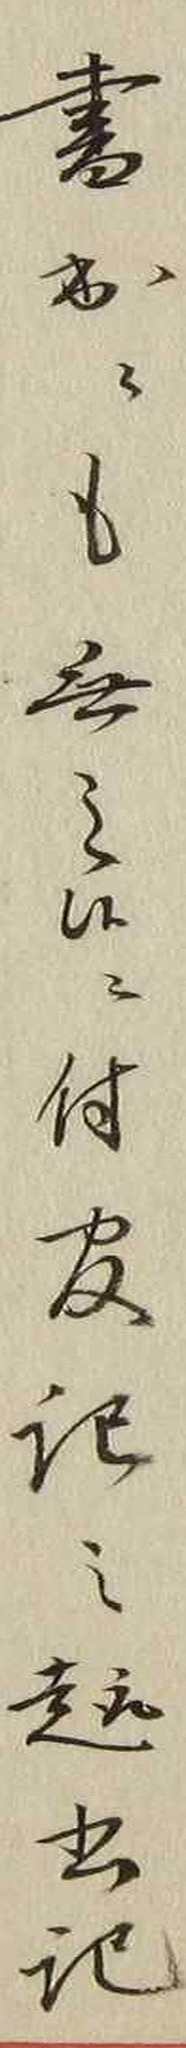書出ニも無之候ニ付官記之趣書記
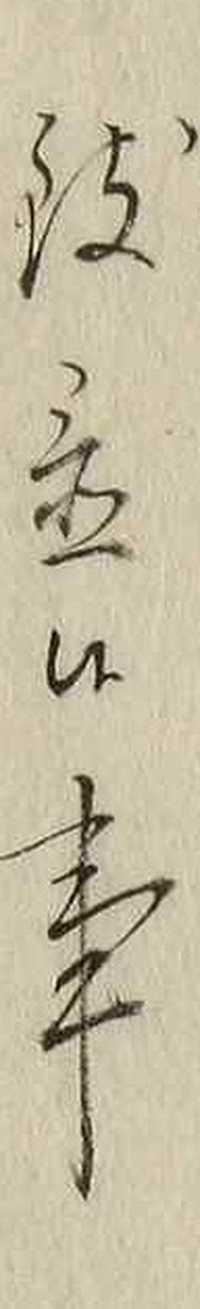致置候事
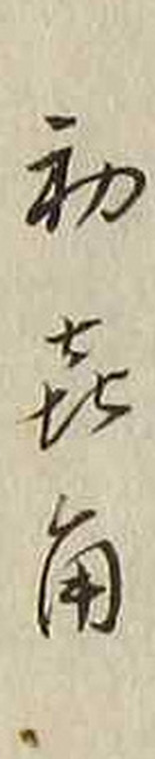初喜角
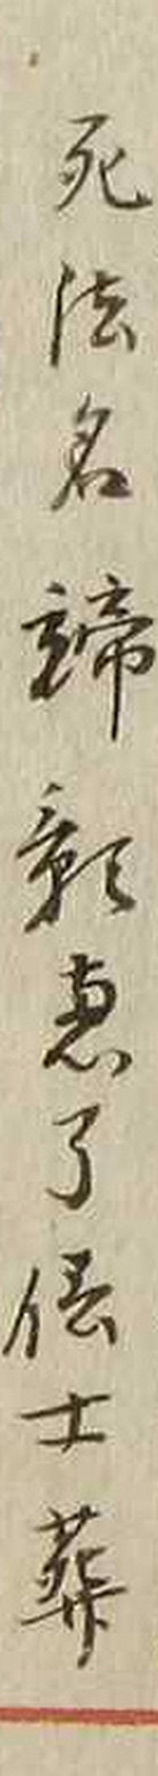死法名諦影恵了信士葬
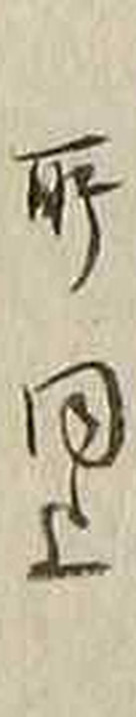所同上
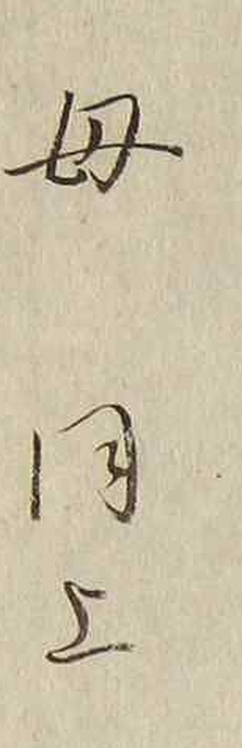母同上

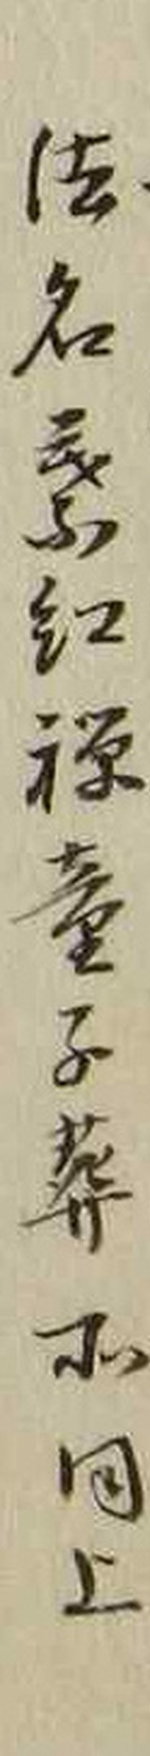法名葉紅禅童子葬所同上
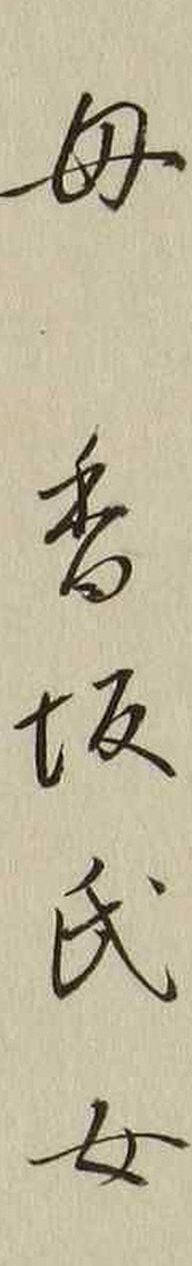母香坂氏女
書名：諸士系譜　巻之22　い之部22
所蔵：会津若松市立会津図書館
